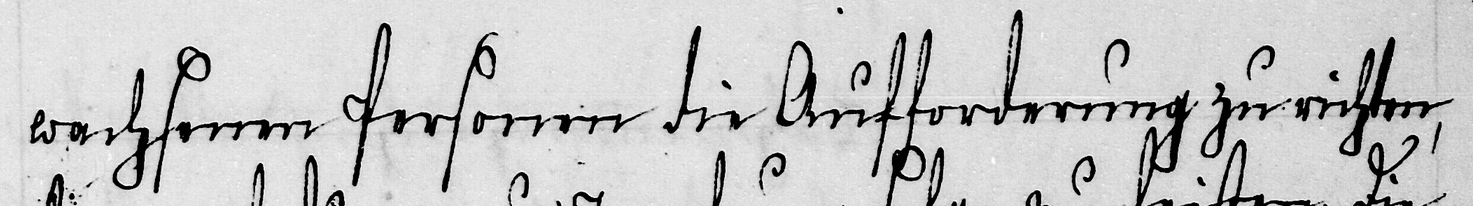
wachsenen Personen die Aufforderung zu richten
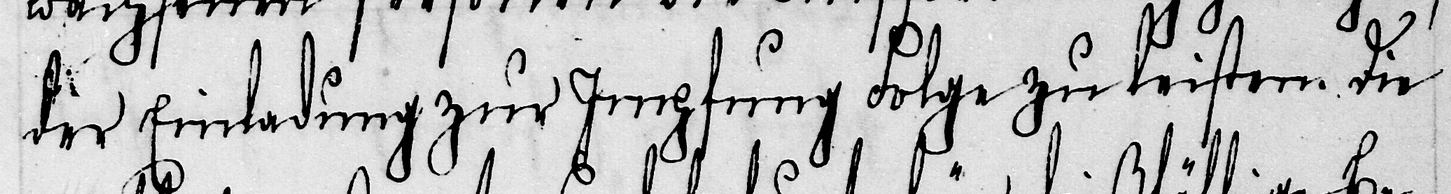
der Einladung zur Impfung Folge zu leisten. Die
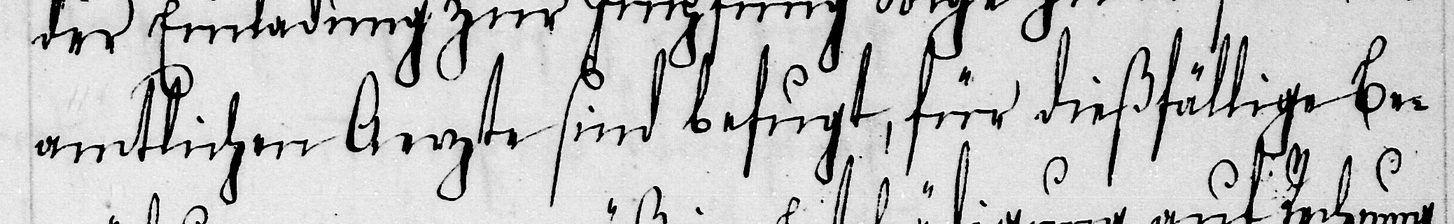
amtlichen Aerzte sind befugt, für dießfällige Be¬
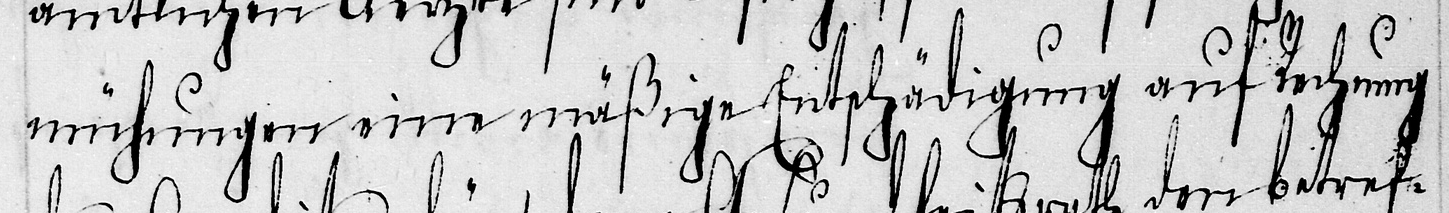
mühungen eine mäßige Entschädigung auf Rechnung
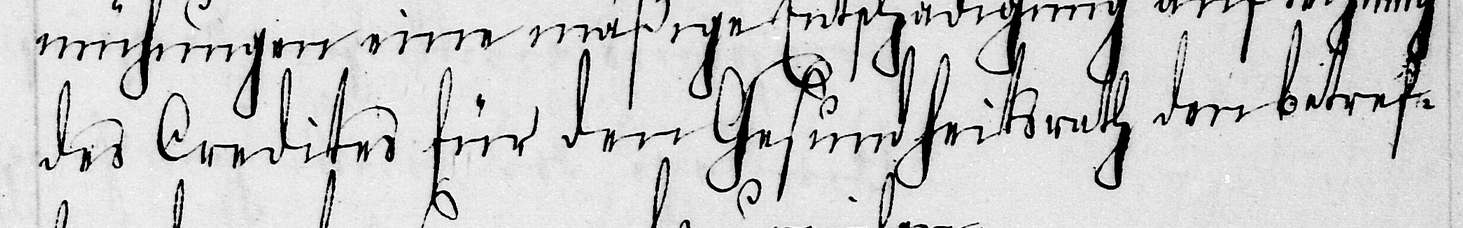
des Credites für den Gesundheitsrath den betref¬
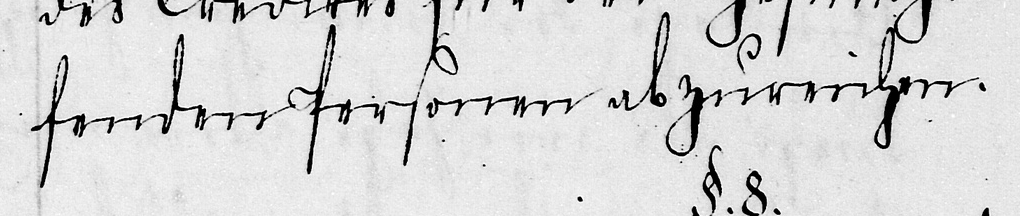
fenden Personen abzureichen.
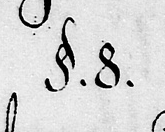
§. 8.
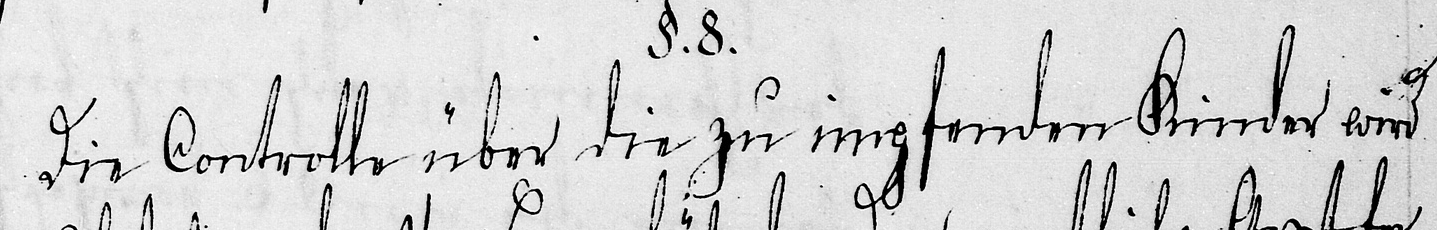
Die Controlle über die zu impfenden Kinder wird
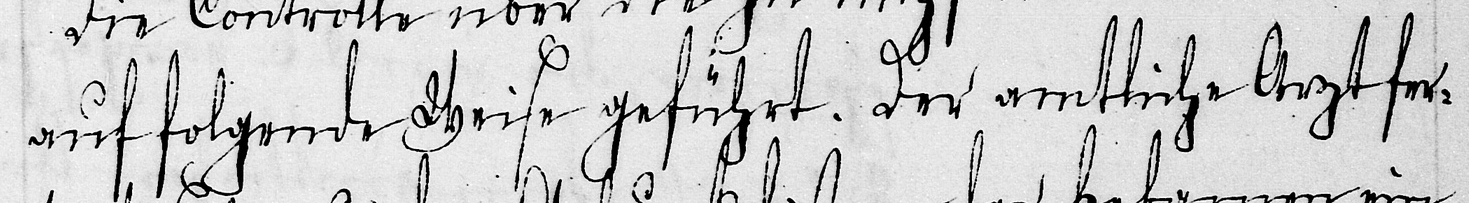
auf folgende Weise geführt. Der amtliche Arzt fer¬
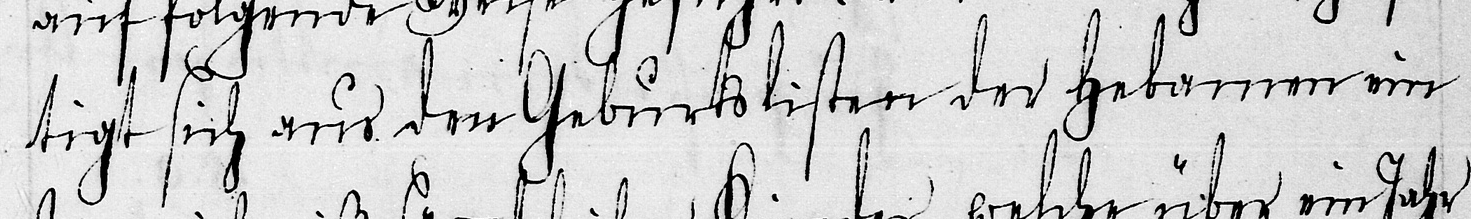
tigt sich aus den Geburtslisten der Hebammen ein
